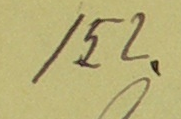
153
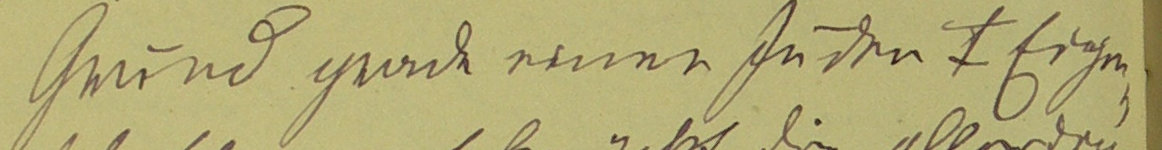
Grund gerade einen Juden mit Eigen¬
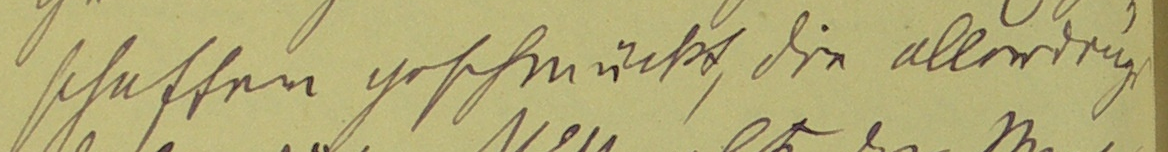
schaften geschmückt , die allerdings
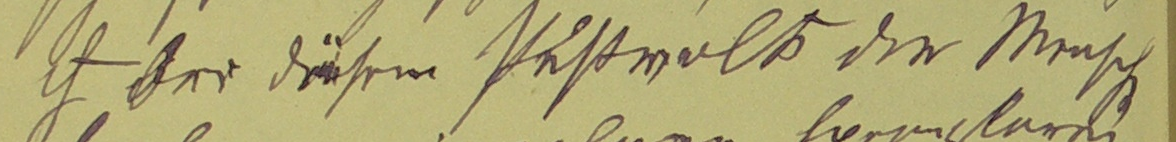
auch bei diesem Pestvolk der Mensch¬
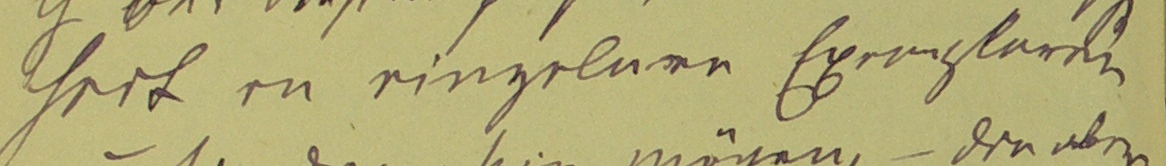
heit in einzelnen Exemplaren
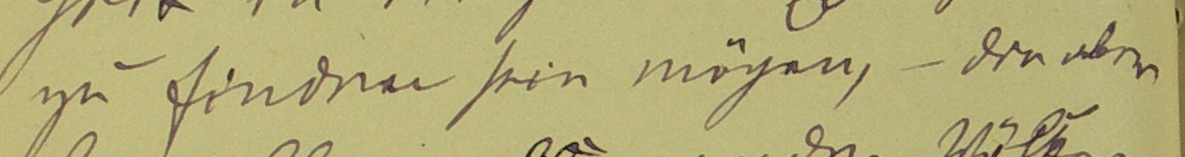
zu finden sein mögen – die aber
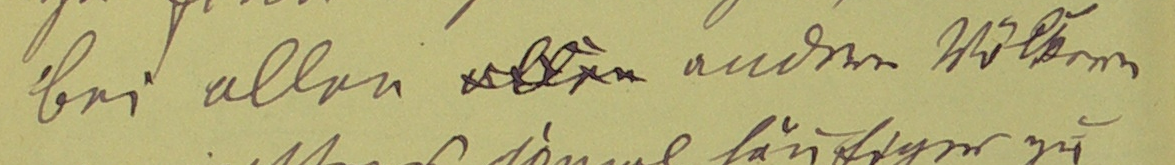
bei allen anderen Völker
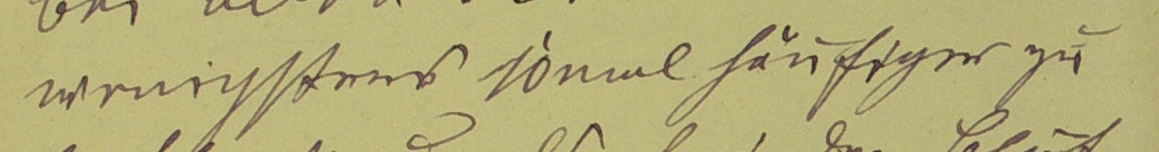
wenigstens 10 mal häufiger zu
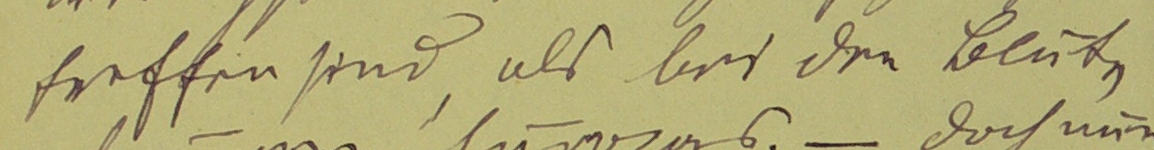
treffen sind, als bei den Blut¬
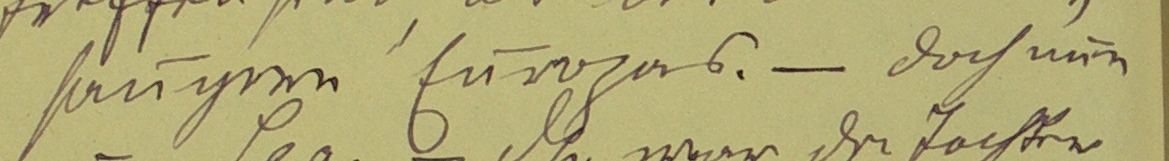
saugern Europas.— Doch nun
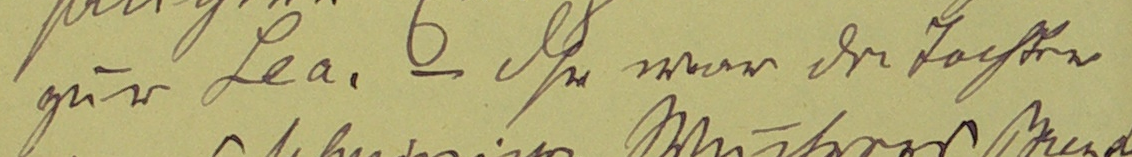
zur Lea.- Diese war die Tochter
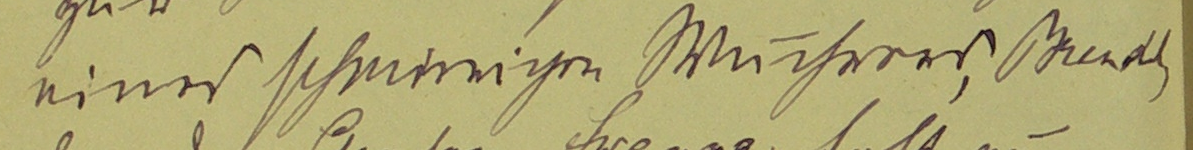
eines schmierigen Wucherers, Brendel,
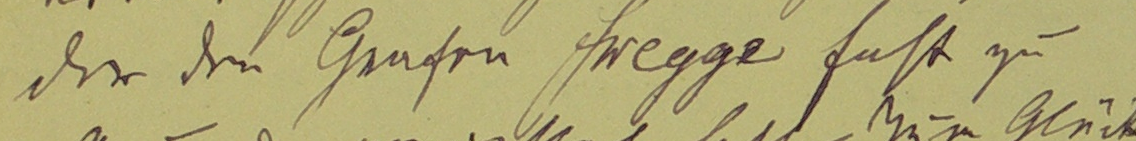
der den Grafen Fregge fast zu
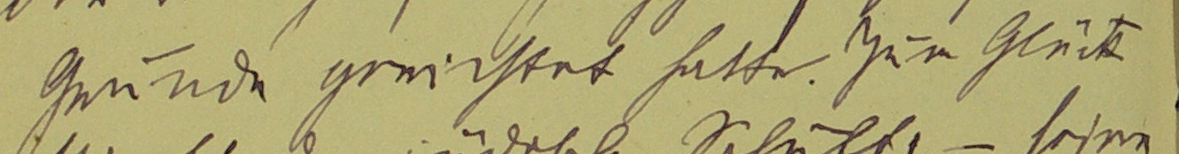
Grunde gerichtet hatte. Zum Glück
